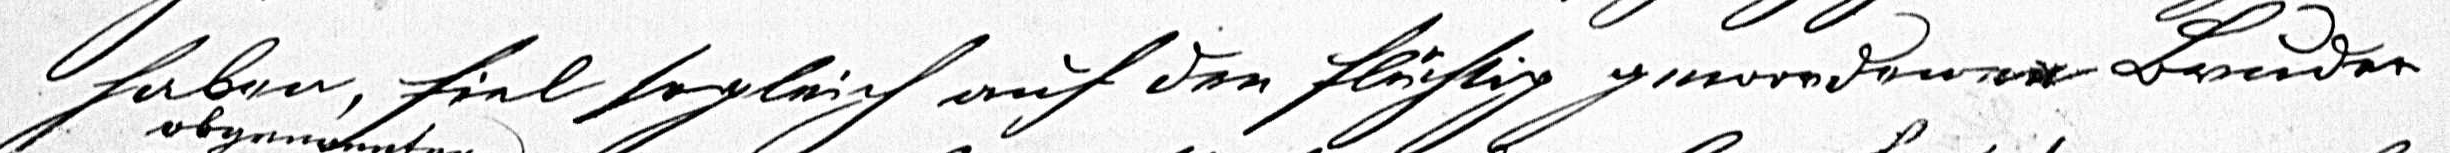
haben, fiel sogleich auf den flüchtig gewordenen Bruder
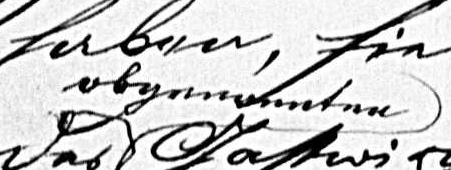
obgenannten
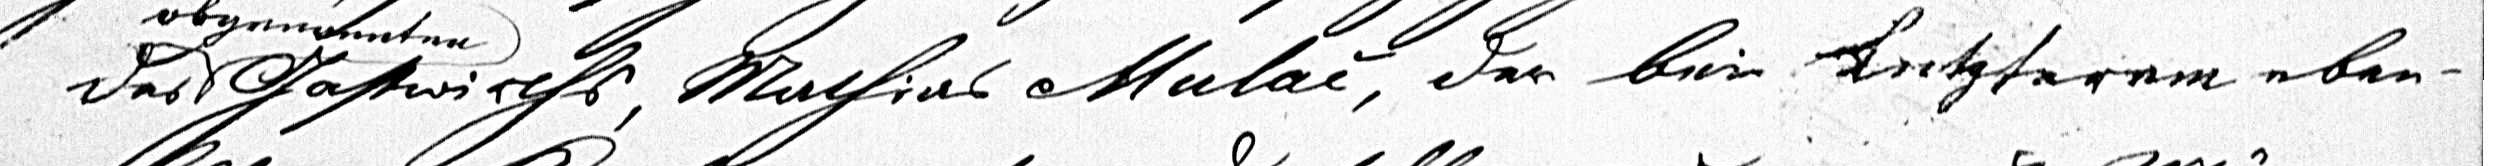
des Gastwirths, Mathias Mulač, der bei Letzterem eben¬
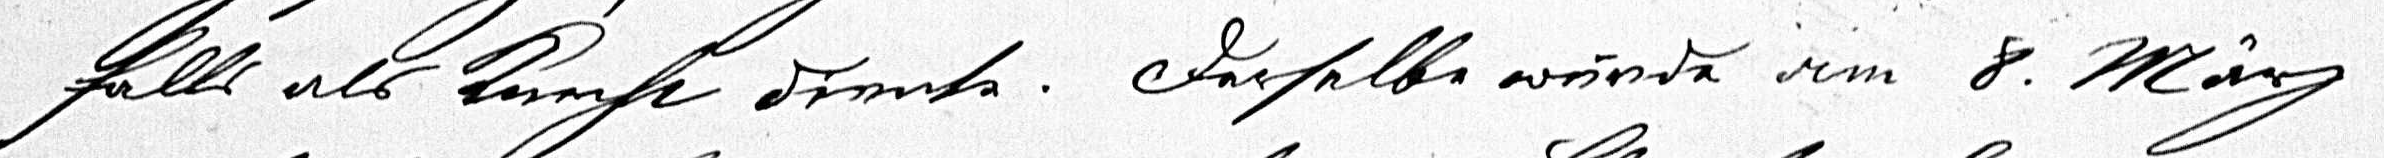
falls als Knecht diente. Derselbe wurde am 8. März
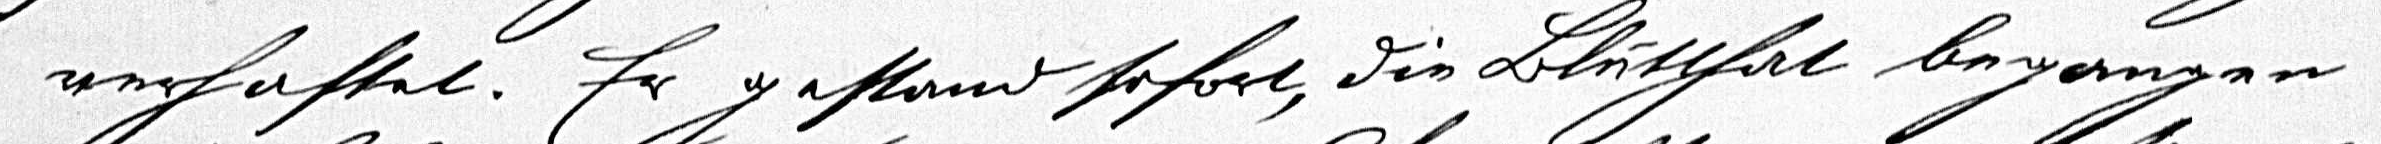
verhaftet. Er gestand sofort, die Blutthat begangen
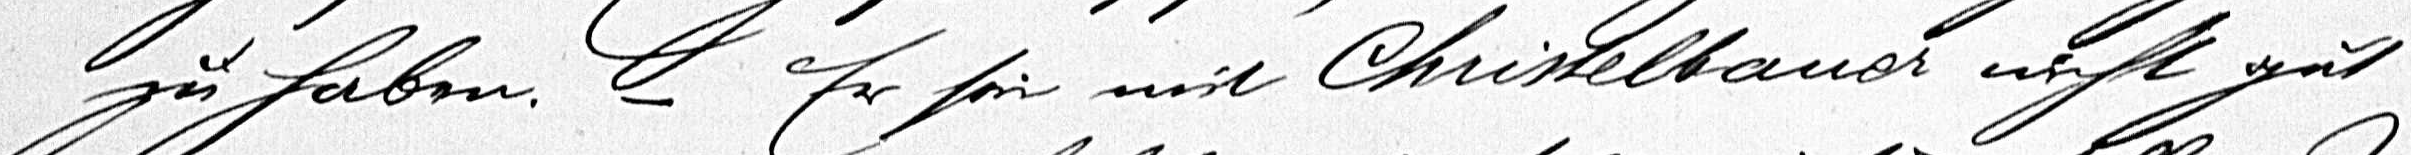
zu haben. Er sei mit Christelbauer nicht gut
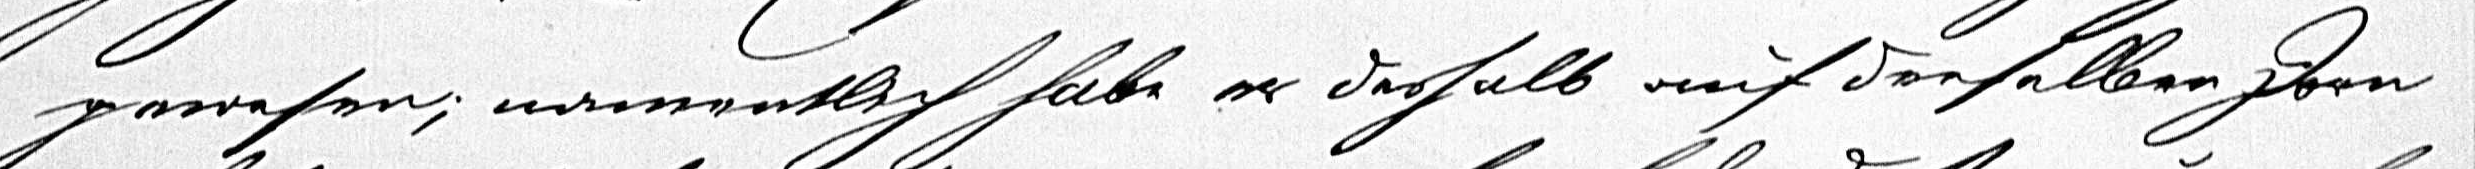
gewesen; namentlich habe er deshalb auf denselben Zorn
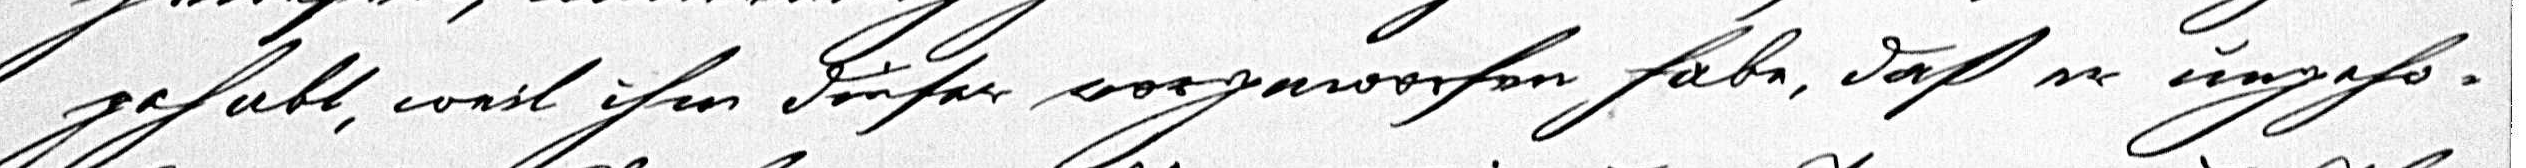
gehabt, weil ihm dieser vorgeworfen habe, daß er ungeho¬
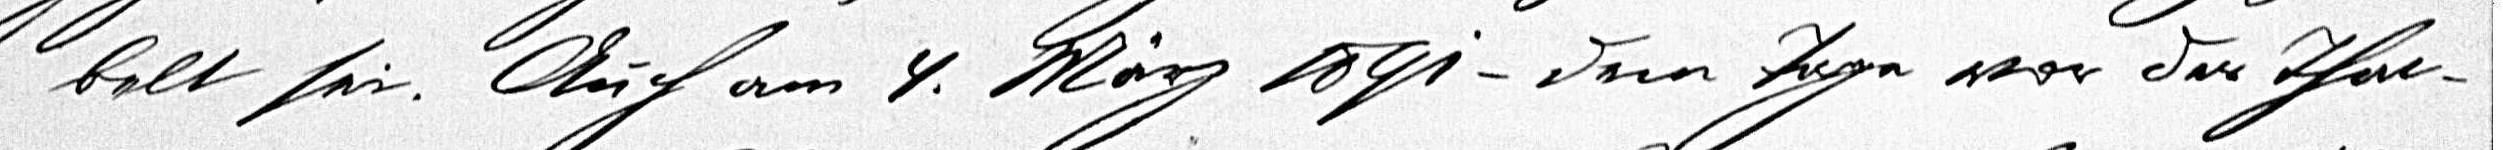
belt sei. Auch am 4. März 1891 – dem Tage vor der That –
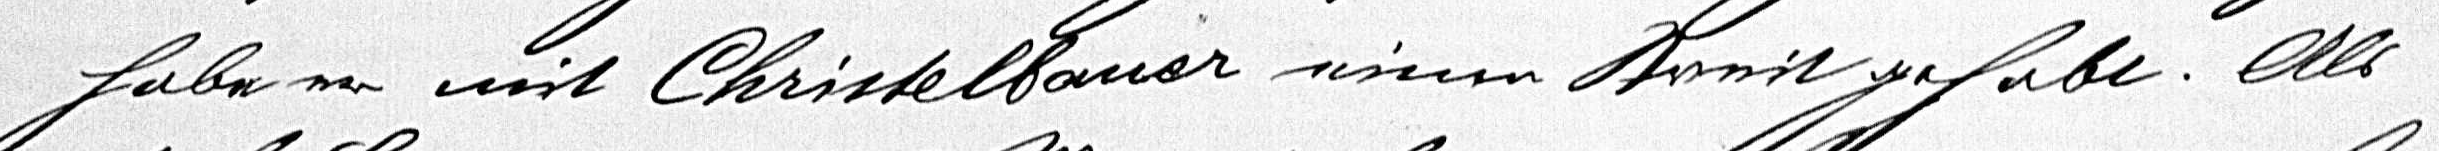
habe er mit Christelbauer einen Streit gehabt. Als
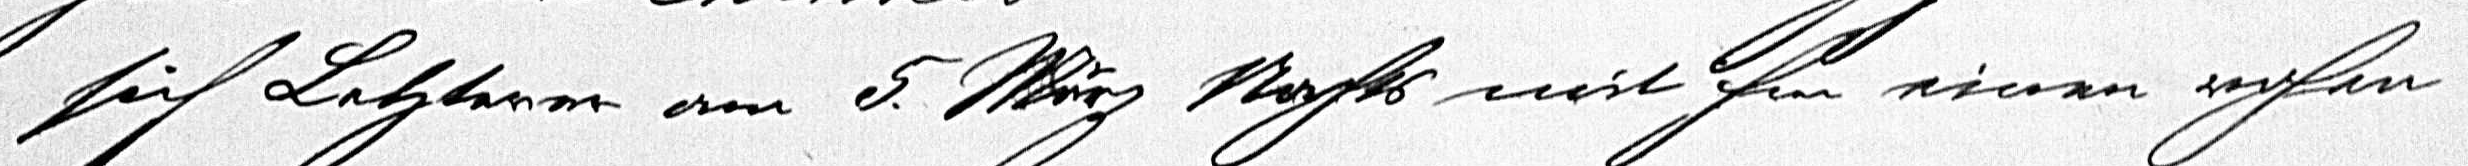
sich Letzterer am 5. März Nachts mit ihm einen rohen
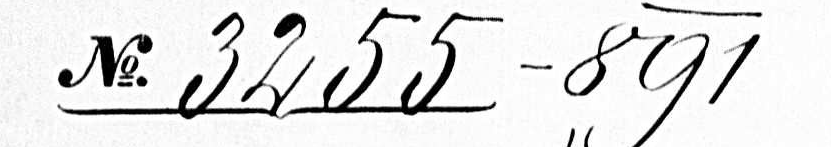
No. 3255 - 1891
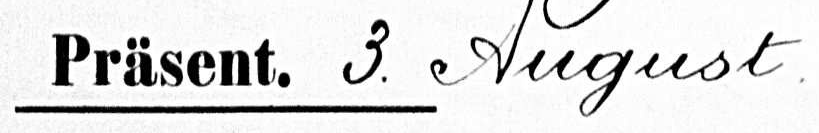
Präsent. 3. August
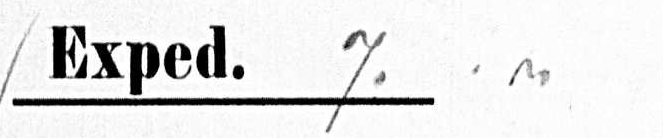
Exped. 7. „
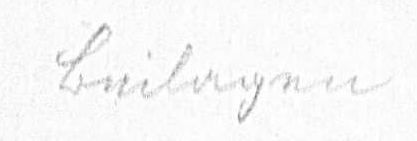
Beilagen
